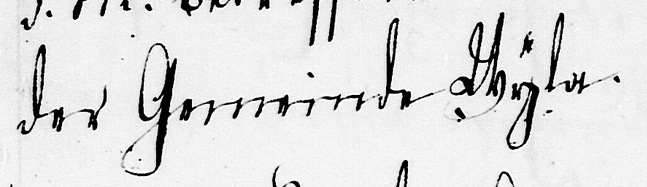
der Gemeinde Wyla.
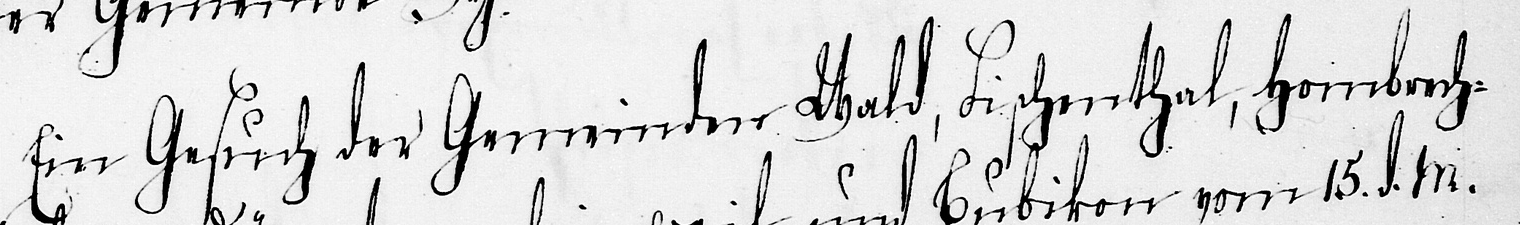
Ein Gesuch der Gemeinden Wald, Fischenthal, Hombrech¬
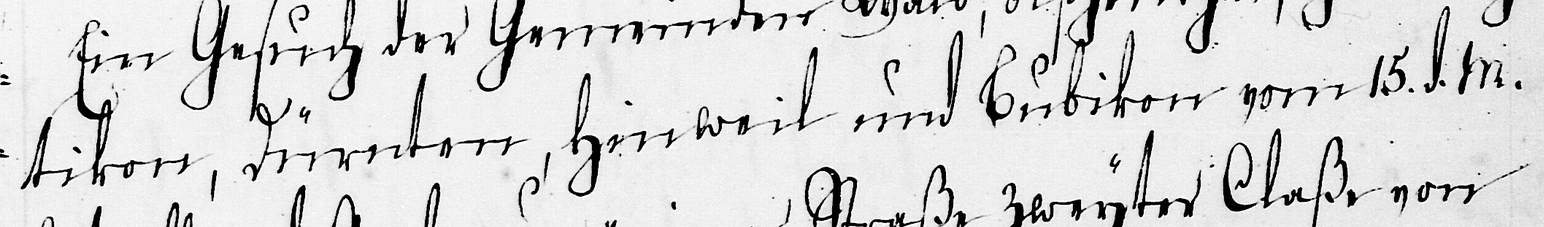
tikon, Dürnten, Hinweil und Bubikon vom 15. d. M.
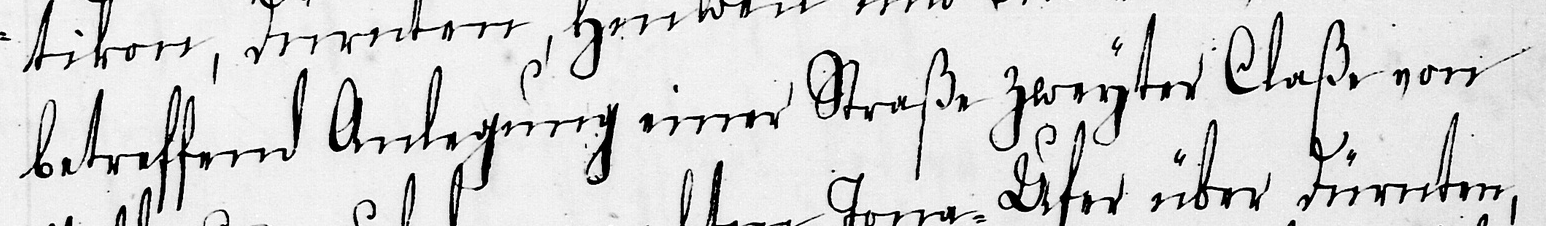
betreffend Anlegung einer Straße zweyter Claße von
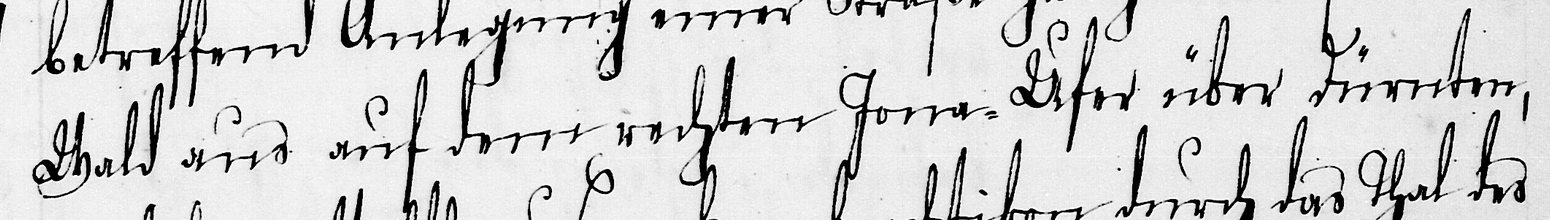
Wald aus auf dem rechten Jona-Ufer über Dürnten,
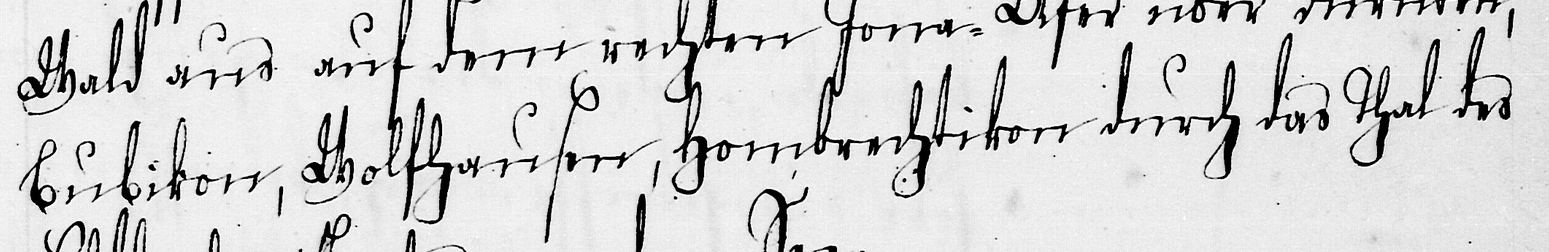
Bubikon, Wolfhausen, Hombrechtikon durch das Thal des
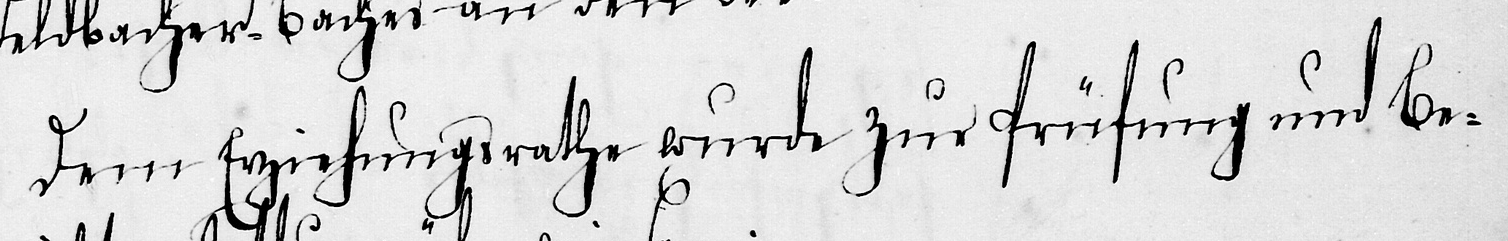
Dem Erziehungsrathe wurde zur Prüfung und Be¬
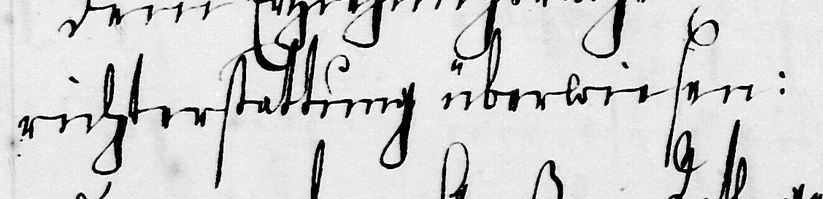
richterstattung überwiesen:
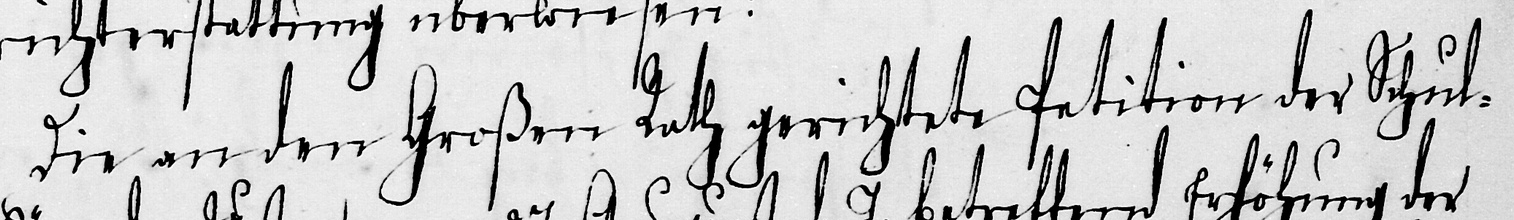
Die an den Großen Rath gerichtete Petition der Schul¬
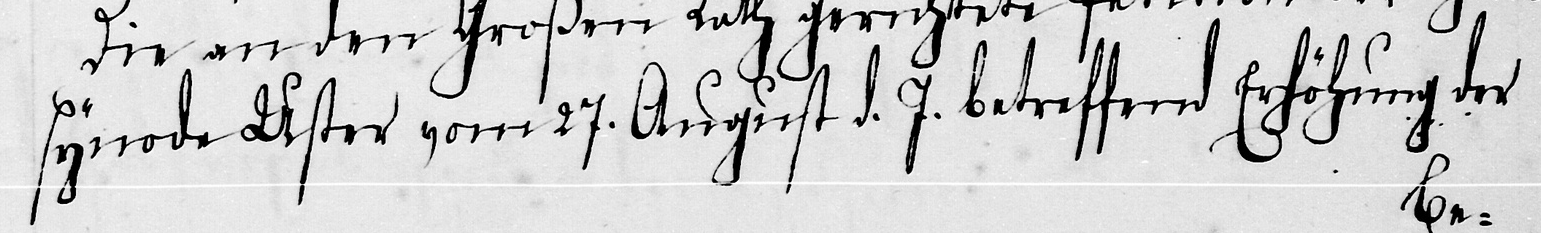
synode Uster vom 27. August d. J. betreffend Erhöhung der
